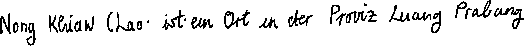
Nong Khiaw (Lao: ist ein Ort in der Provinz Luang Prabang
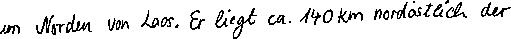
im Norden von Laos. Er liegt ca. 140 km nordöstlich der
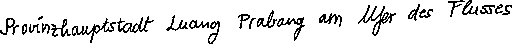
Provinzhauptstadt Luang Prabang am Ufer des Flusses
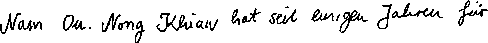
Nam Ou. Nong Khiaw hat seit einigen Jahren für
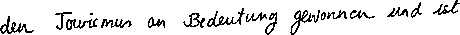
den Tourismus an Bedeutung gewonnen und ist
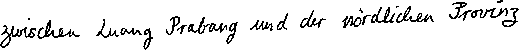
zwischen Luang Prabang und der nördlichen Provinz
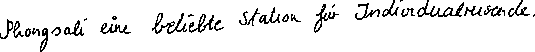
Phongsali eine beliebte Station für Individualreisende.
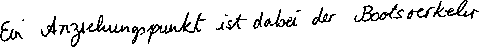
Ein Anziehungspunkt ist dabei der Bootsverkehr
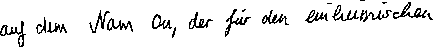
auf dem Nam Ou, der für den einheimischen
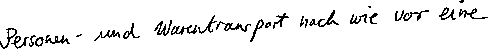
Personen- und Warentransport nach wie vor eine
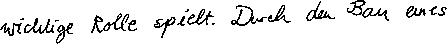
wichtige Rolle spielt. Durch den Bau eines
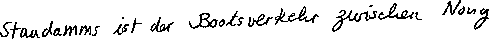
Staudamms ist der Bootsverkehr zwischen Nong
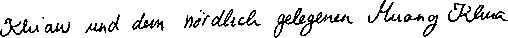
Khiaw und dem nördlich gelegenen Muang Khua
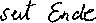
seit Ende
